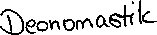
Deonomastik
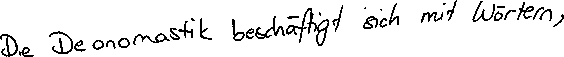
Die Deonomastik beschäftigt sich mit Wörtern,
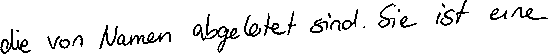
die von Namen abgeleitet sind. Sie ist eine
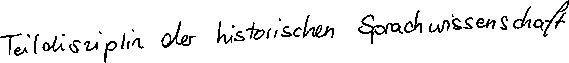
Teildisziplin der historischen Sprachwissenschaft
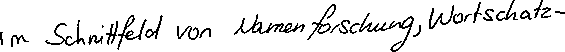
im Schnittfeld von Namenforschung, Wortschatz-
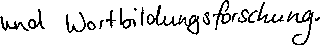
und Wortbildungsforschung.
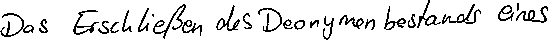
Das Erschließen des Deonymenbestands eines
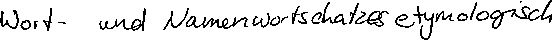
Wort- und Namenwortschatzes etymologisch
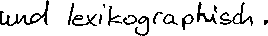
und lexikographisch.
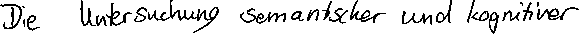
Die Untersuchung semantischer und kognitiver
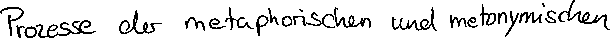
Prozesse der metaphorischen und metonymischen
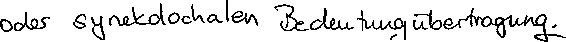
oder synekdochalen Bedeutungsübertragung.
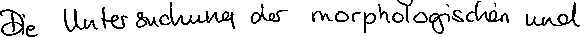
Die Untersuchung der morphologischen und
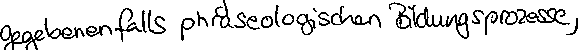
gegebenenfalls phraseologischen Bildungsprozesse,
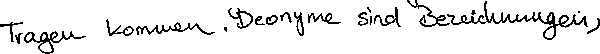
Tragen kommen.Deonyme sind Bezeichnungen,
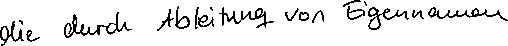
die durch Ableitung von Eigennamen
